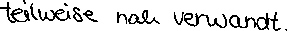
teilweise nah verwandt.
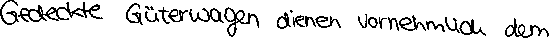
Gedeckte Güterwagen dienen vornehmlich dem
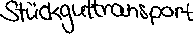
Stückguttransport
